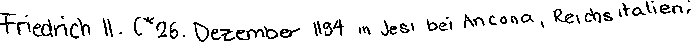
Friedrich II. (* 26. Dezember 1194 in Jesi bei Ancona, Reichsitalien;
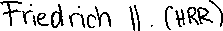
Friedrich II. (HRR)
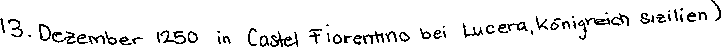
13. Dezember 1250 in Castel Fiorentino bei Lucera, Königreich Sizilien)
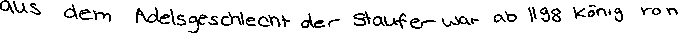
aus dem Adelsgeschlecht der Staufer war ab 1198 König von
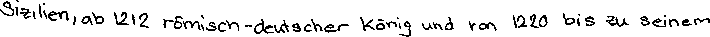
Sizilien, ab 1212 römischdeutscher König und von 1220 bis zu seinem
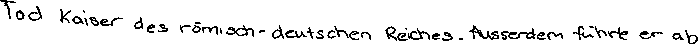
Tod Kaiser des römisch-deutschen Reiches. Außerdem führte er ab
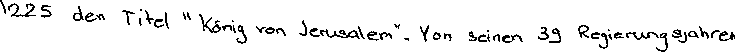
1225 den Titel "König von Jerusalem". Von seinen 39 Regierungsjahren
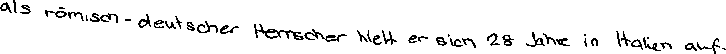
als römisch-deutscher Herrscher hielt er sich 28 Jahre in Italien auf.
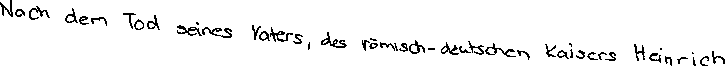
Nach dem Tod seines Vaters, des römisch-deutschen Kaisers Heinrich
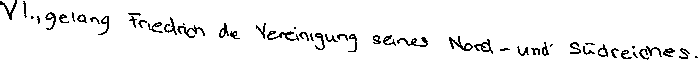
VI., gelang Friedrich die Vereinigung seines Nord- und Südreiches
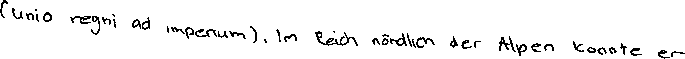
(unio regni ad imperium). Im Reich nördlich der Alpen konnte er
